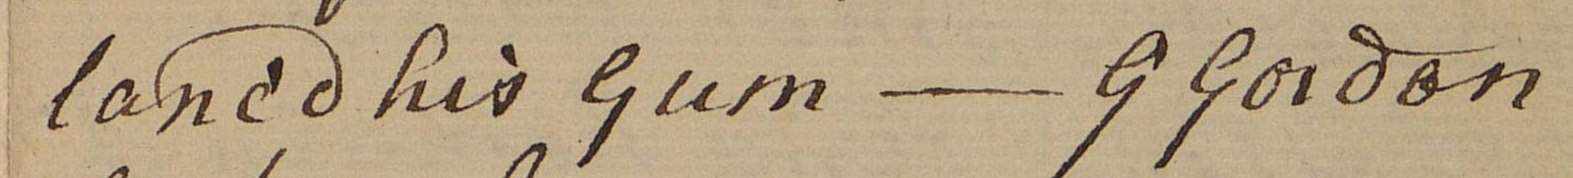lanc'd his Gum- G Gordon
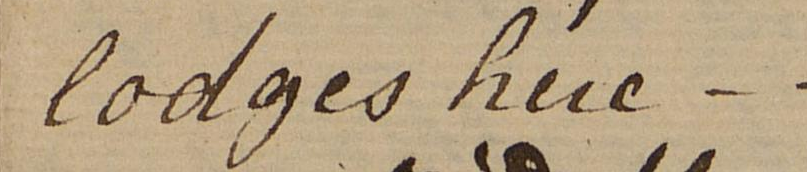lodges here-
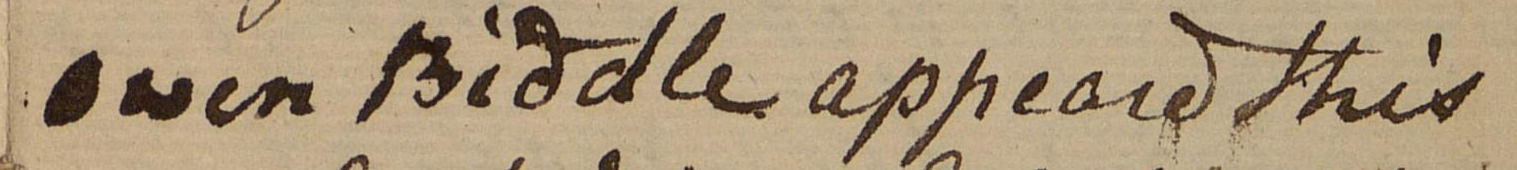Owen Biddle appeard this
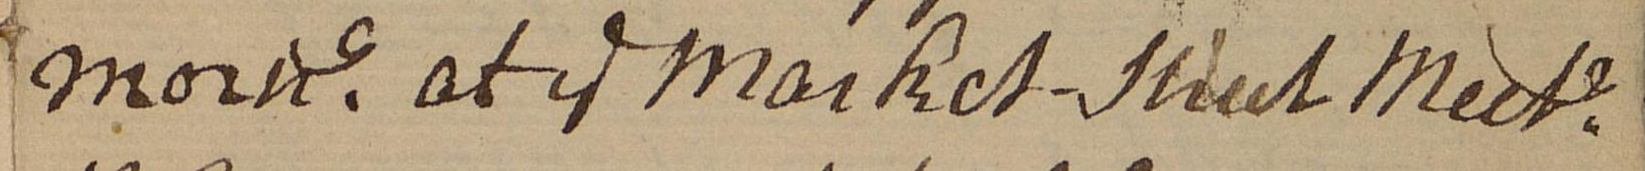morn^g. at y^e Market Street Meet^g.
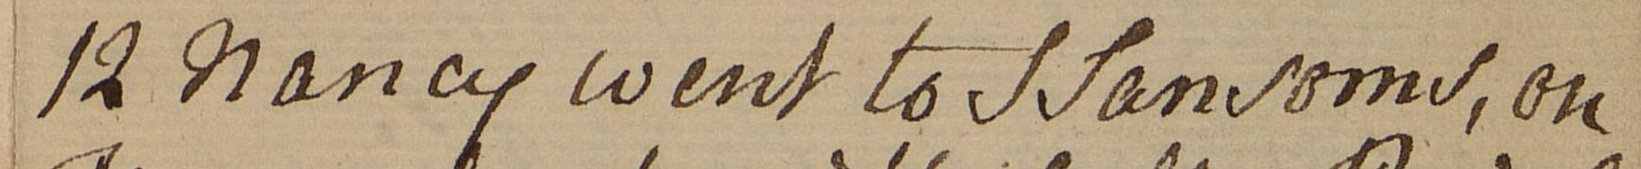12 Nancy went to S Sansoms, on
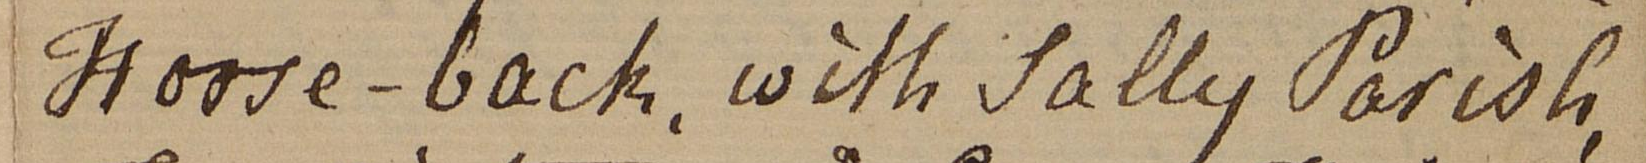Horse- back, with Sally Parish
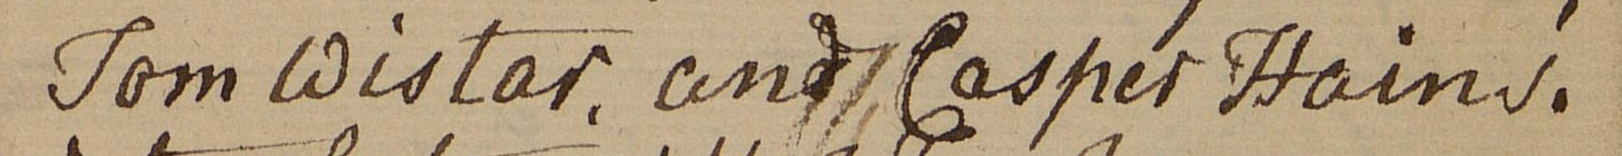Tom Wistar, ands Casper Hains.
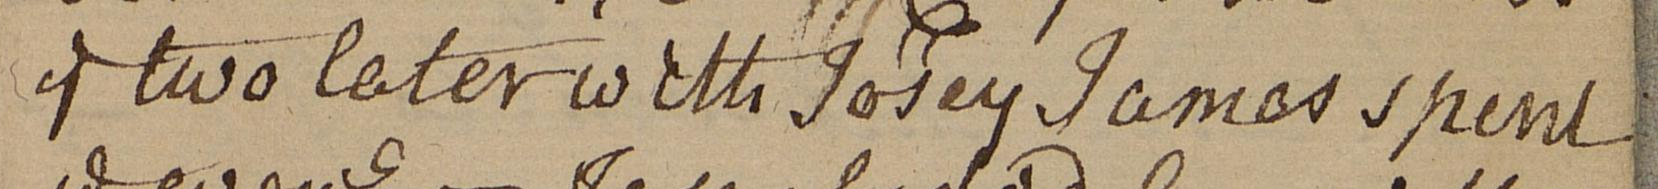y^e two later with Josey James spent
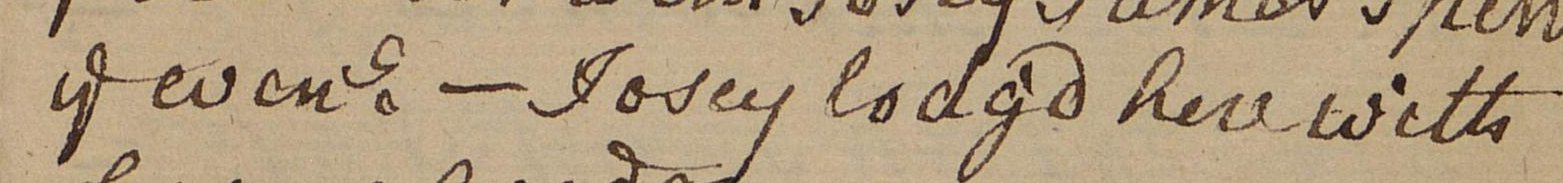y^e even^g- Josey lodg'd here with
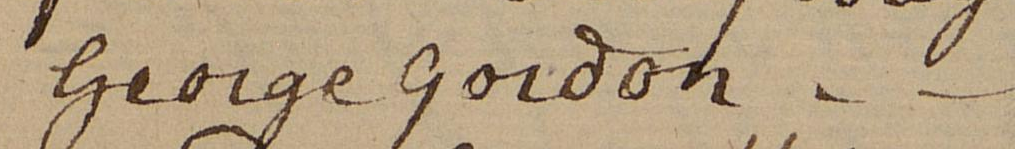George Gordon-
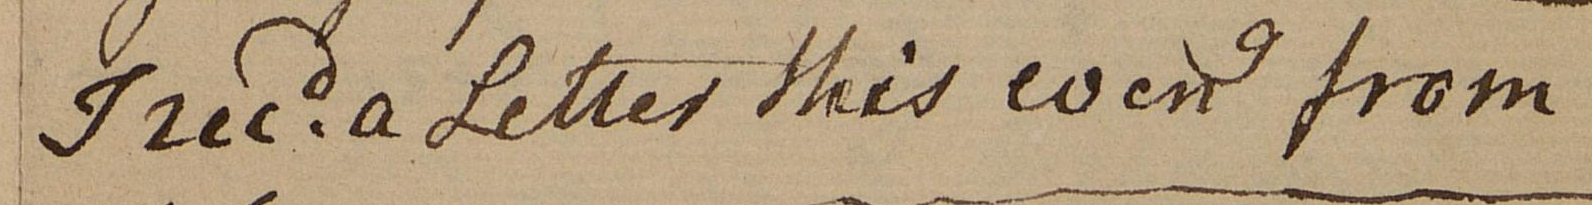I rec^d. a Letter this even^g from
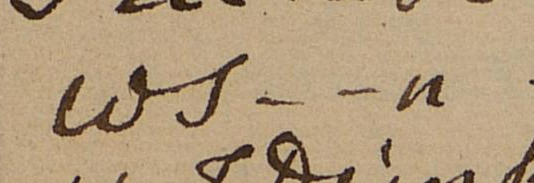W S-- n
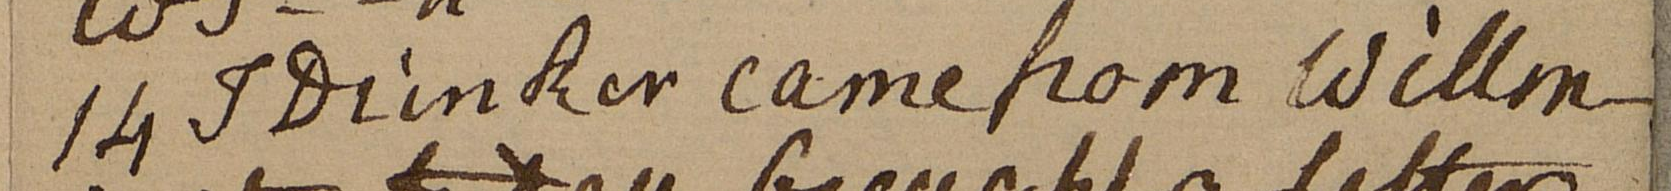14 J Drinker came from Willm
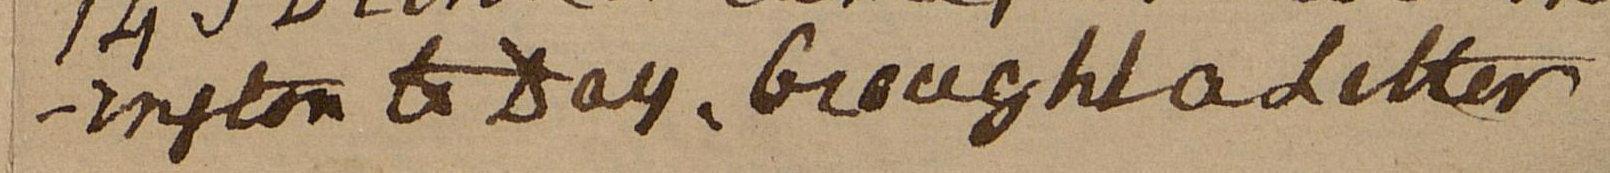-ington to Day, brought a Letter
